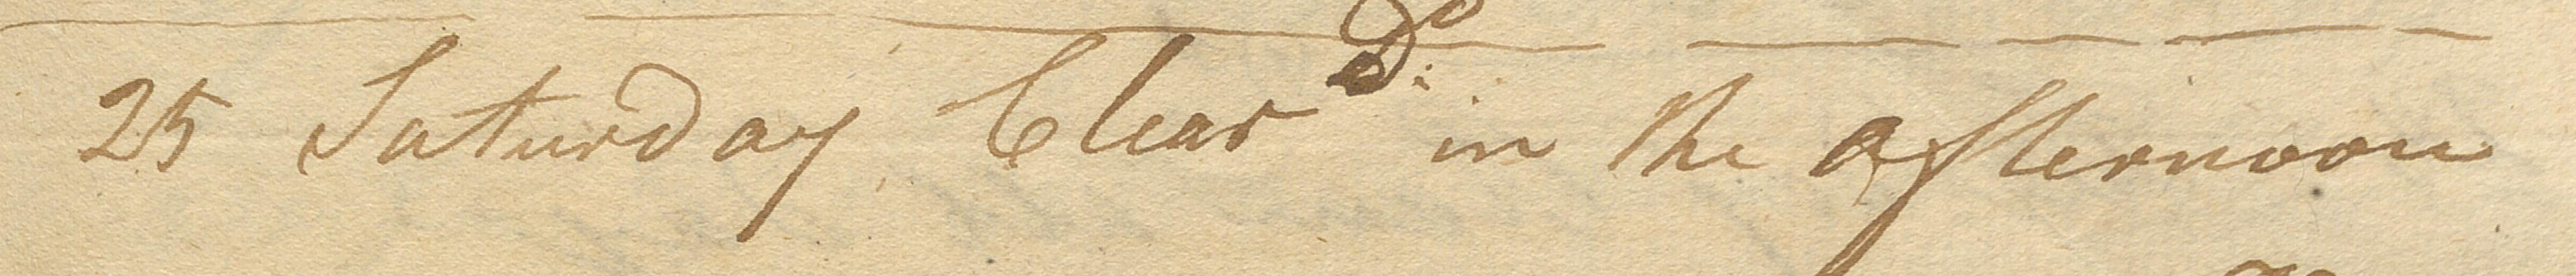25 Saturday Clear in the afternoon
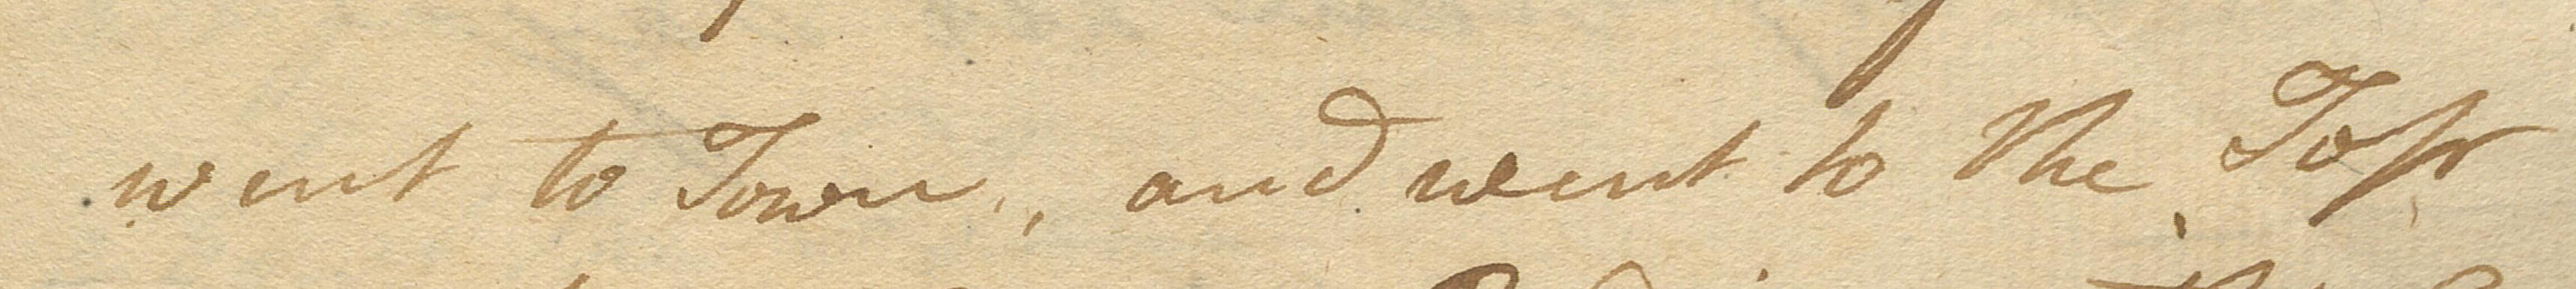went to Town, and went to the Top
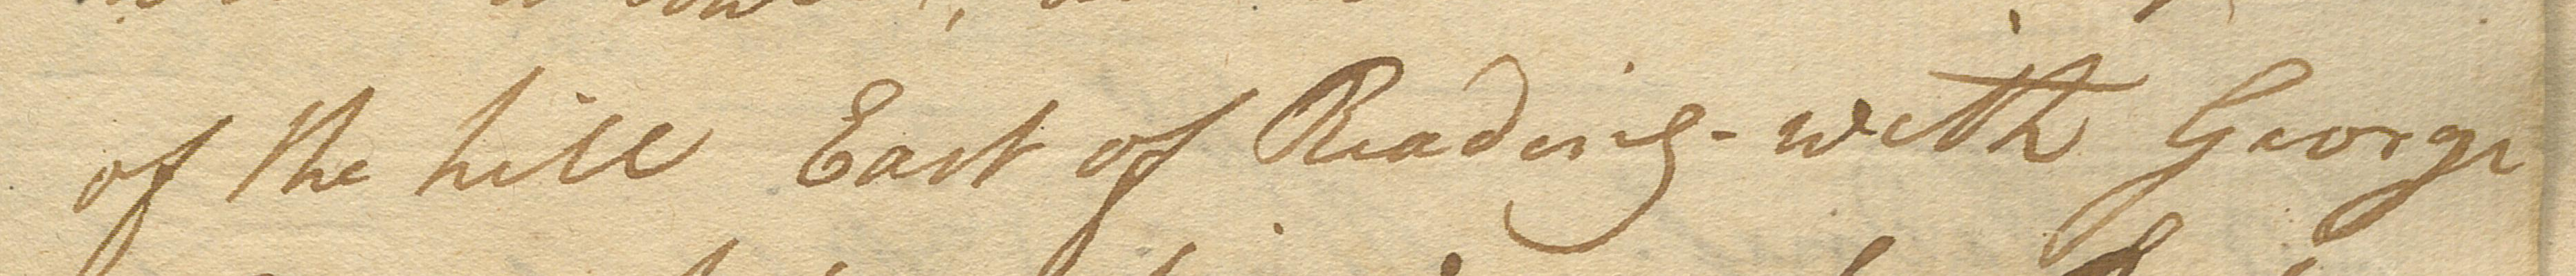of the hill East of Reading with George
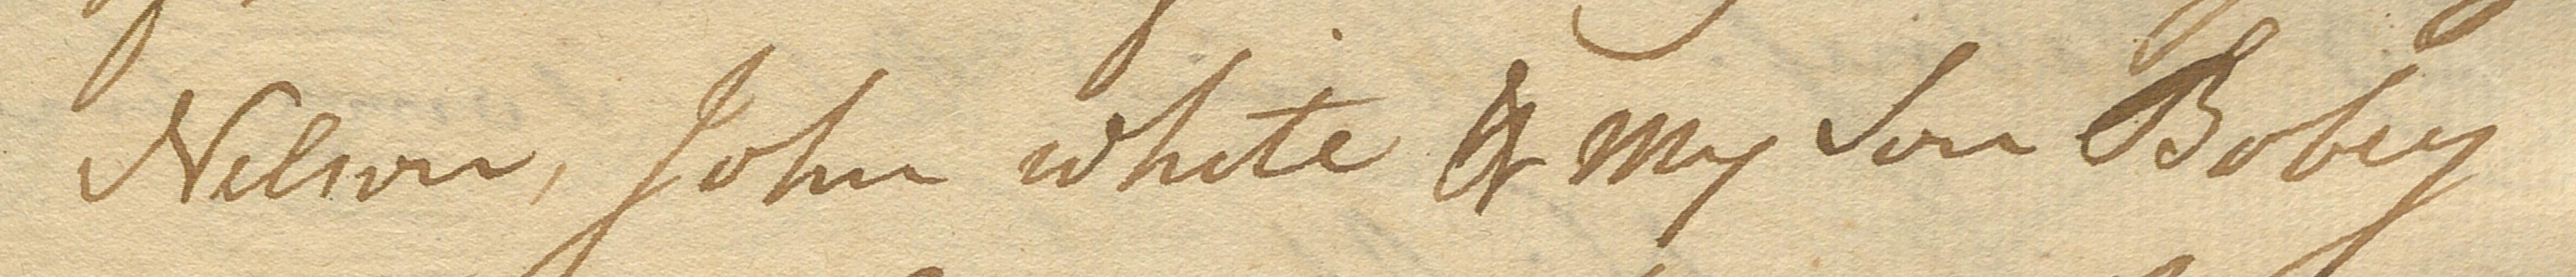Nelson, John white & My son Bobey
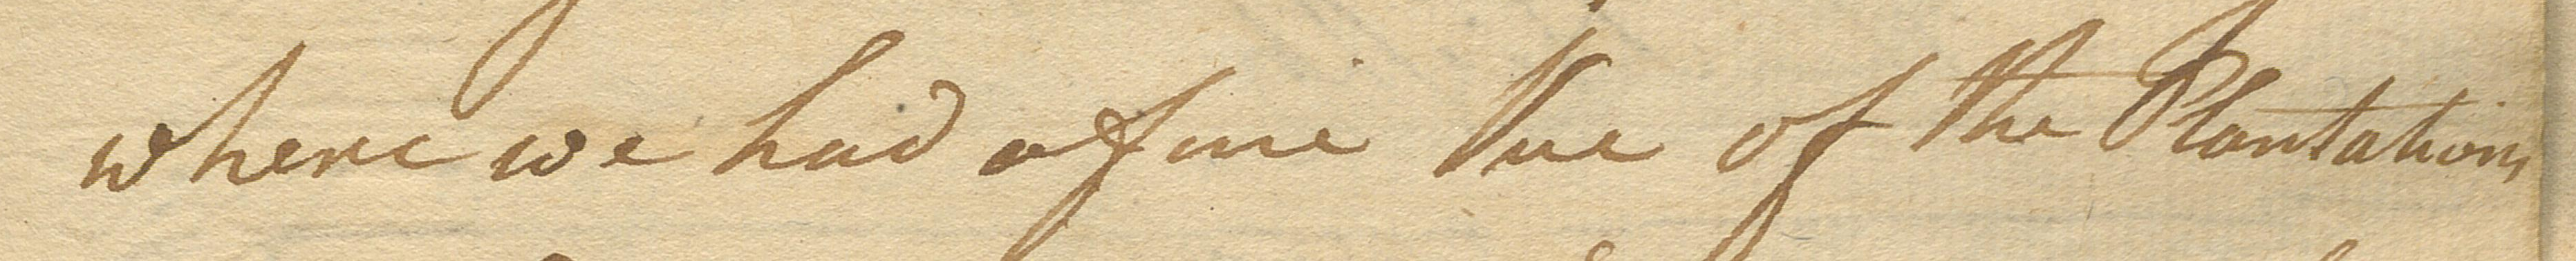where we had a fine Vue of the Plantations
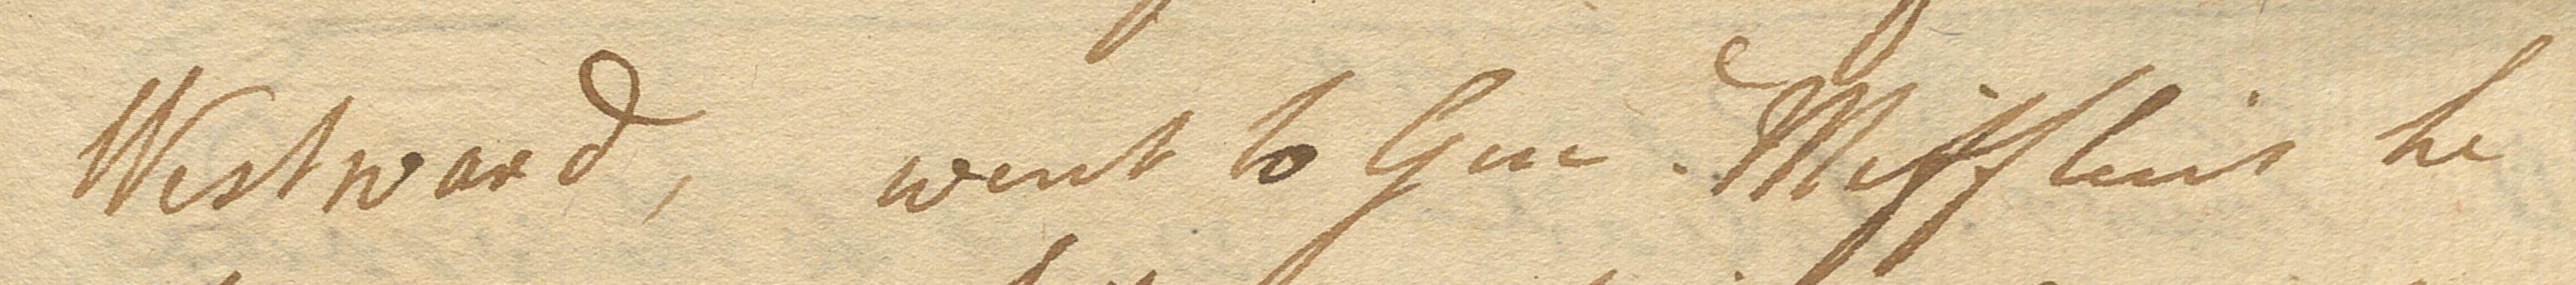Westward, went to Gene^l. Mifflins he
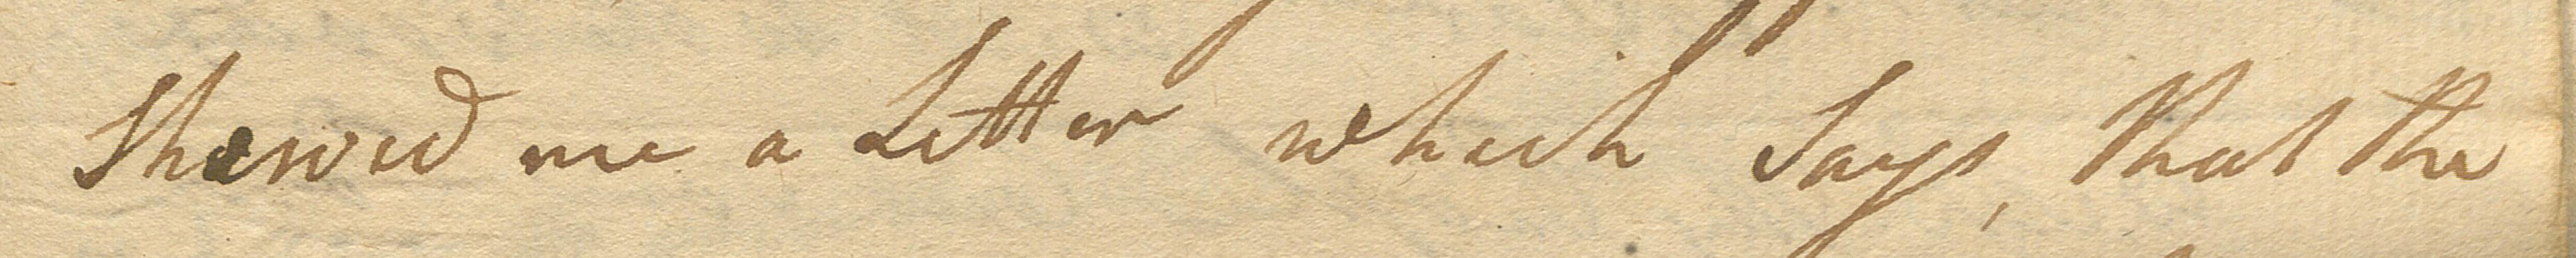Shewed me a Letter which says that the
